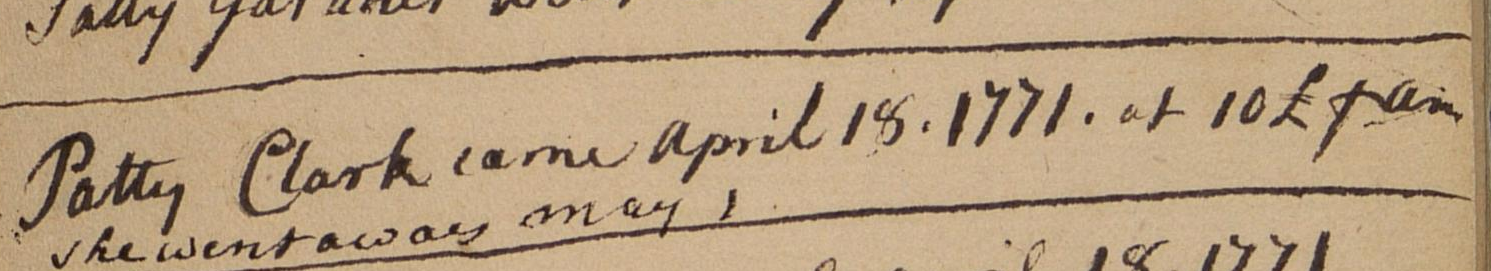Patty Clark came April 18.1771. at 10 sterlings per Ann
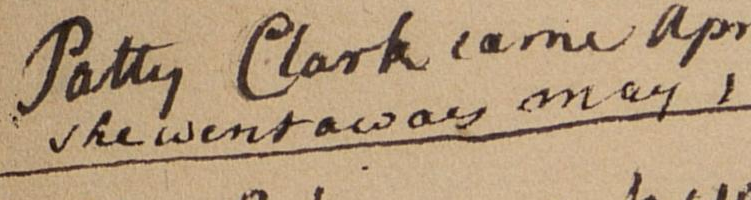she went away May 1
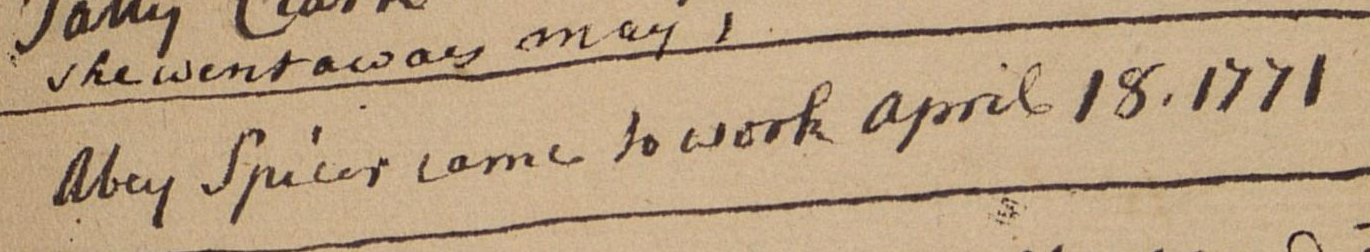Abey Spicer came to work April 18.1771
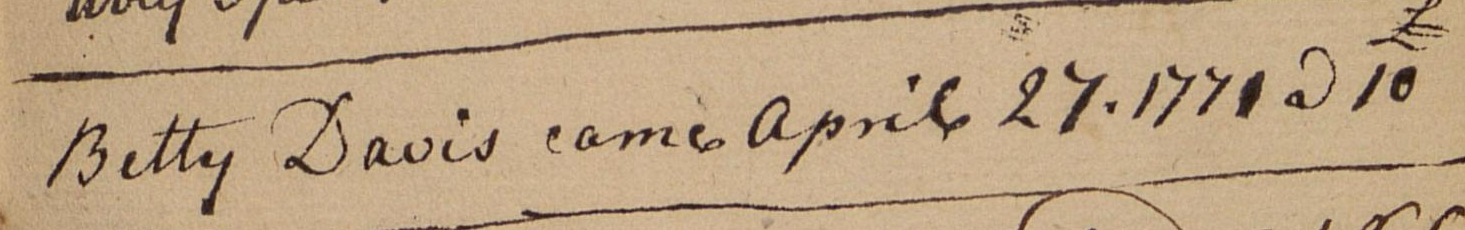Betty Davis came April 27.1771 [at] 10 sterlings
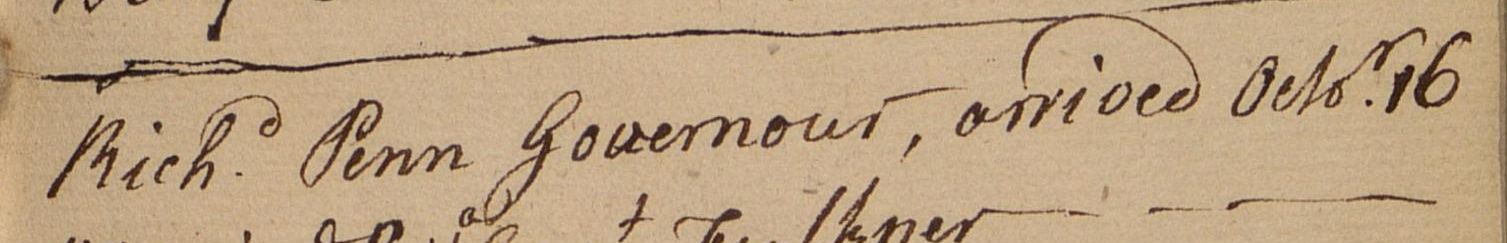Rich^d. Penn Governour, arrived Octo^r. 16
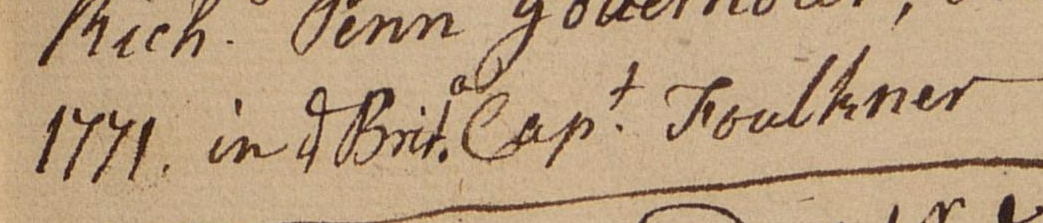1771. in Brit^a. Cap^t. Foulkner
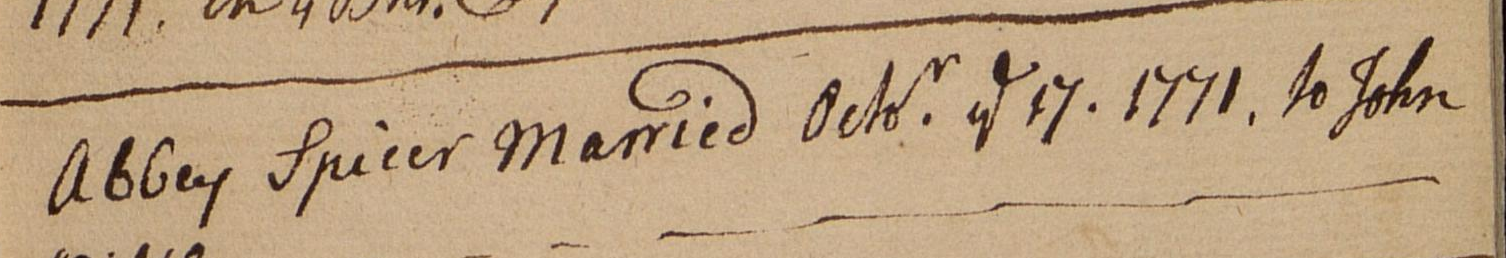Abbey Spicer Married Octo^r. y^e 17. 1771. to John
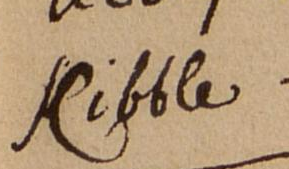Kibble
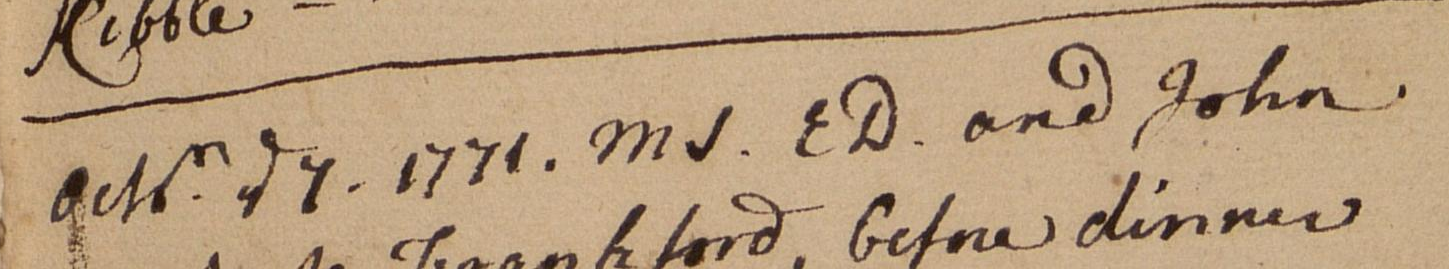Octo^r. y^e 7. 1771. MS. ED. and John
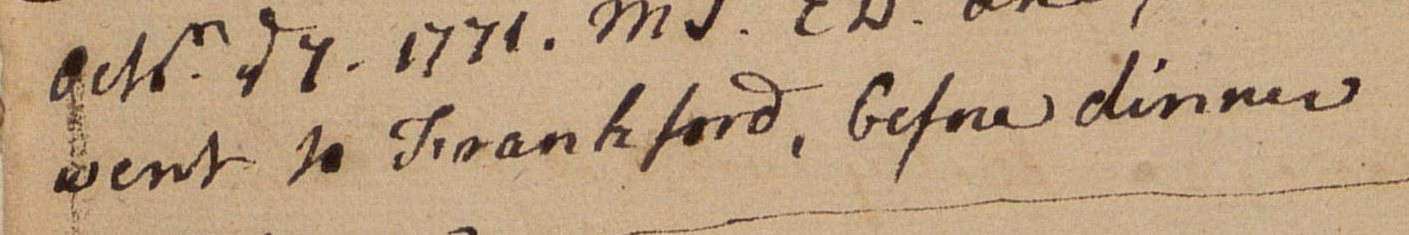went to Frankford, before dinner
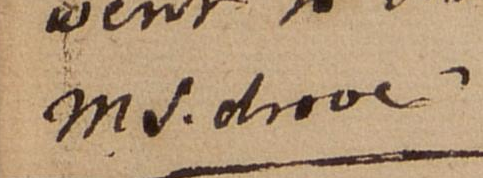MS. drove
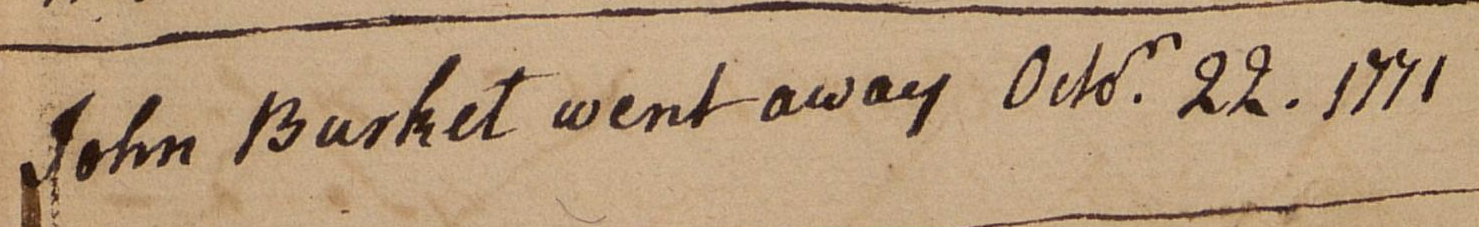John Burket went away Octo^r. 22. 1771
